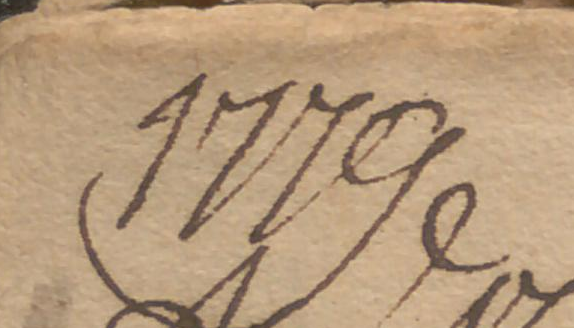1779
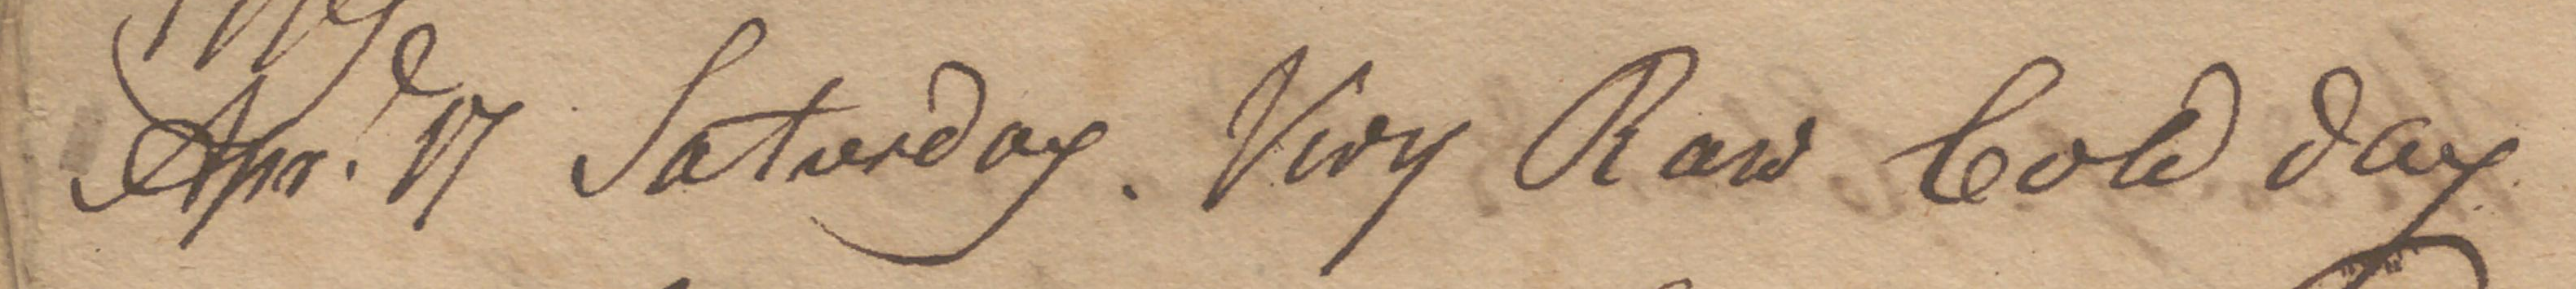Apr^l. 17 Saturday. Very Raw Cold day
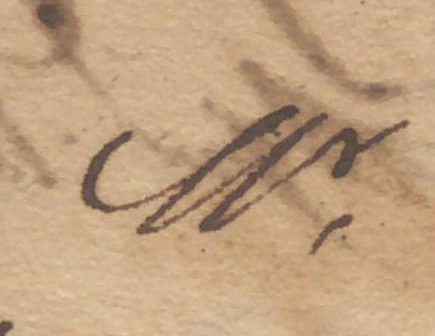M^r.
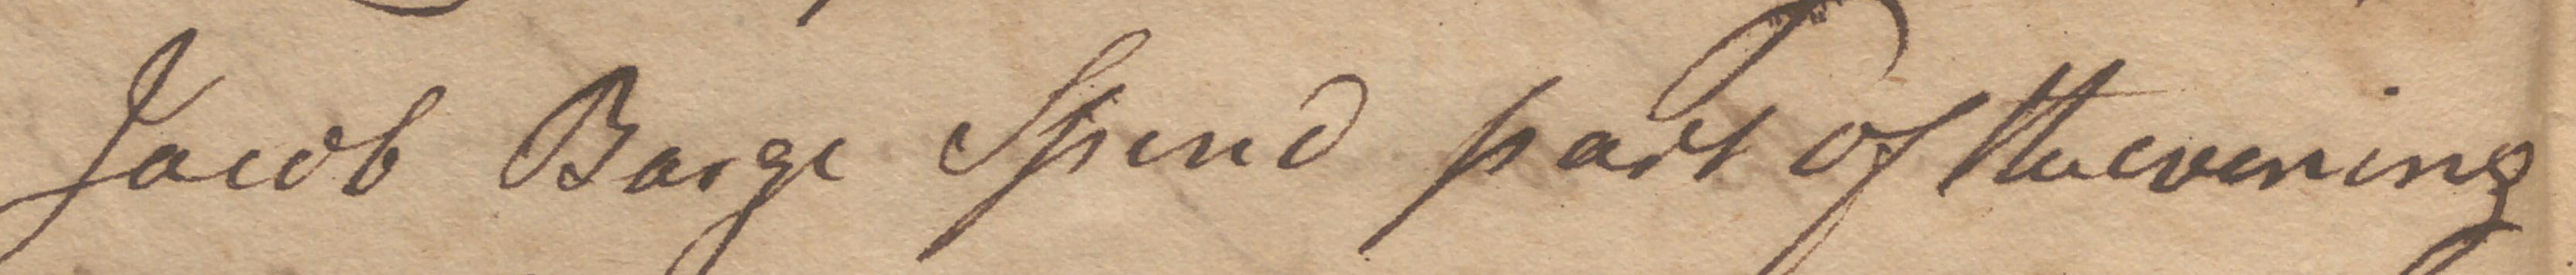Jacb Barge spend part of the evening
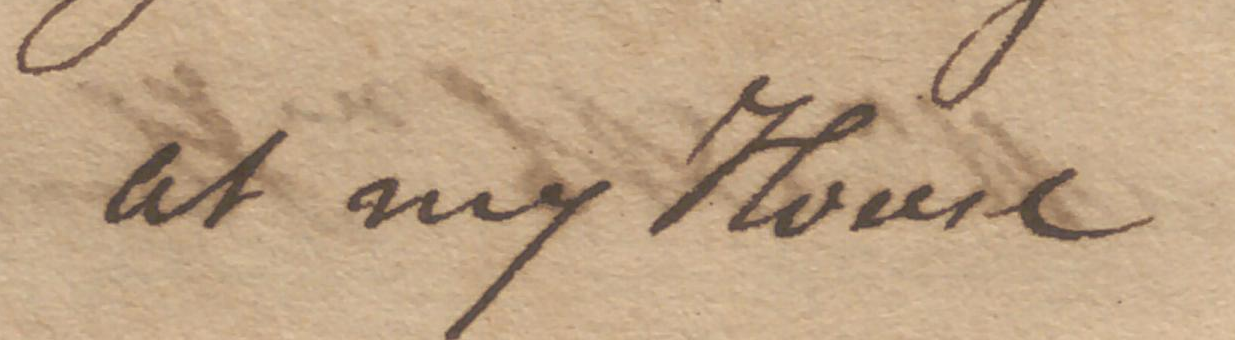at my House
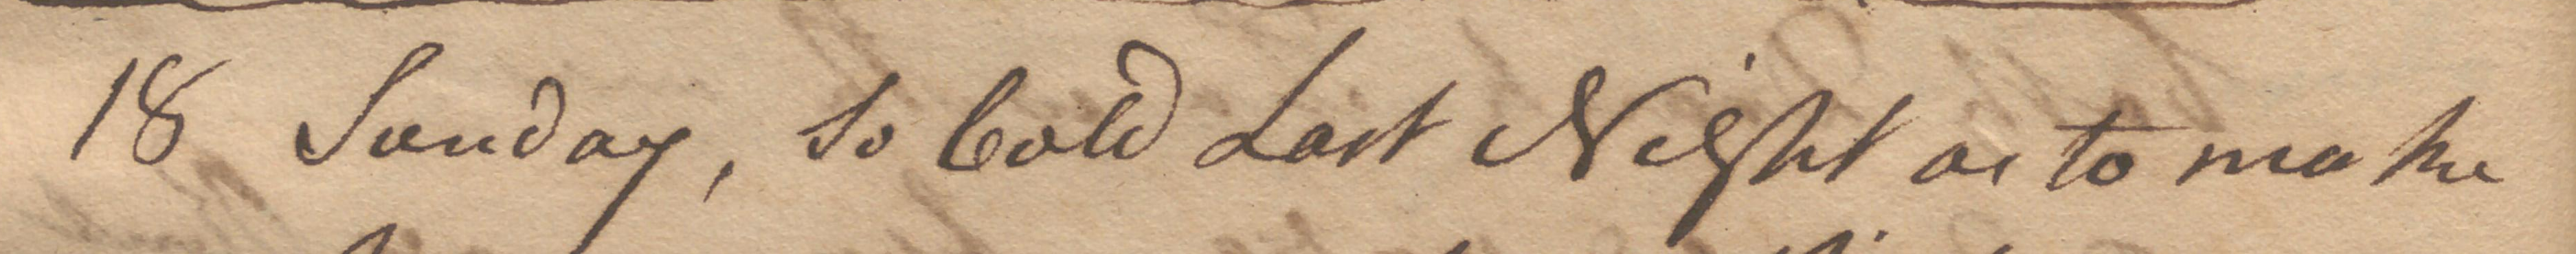18 Sunday, so Cold Last Night as to make
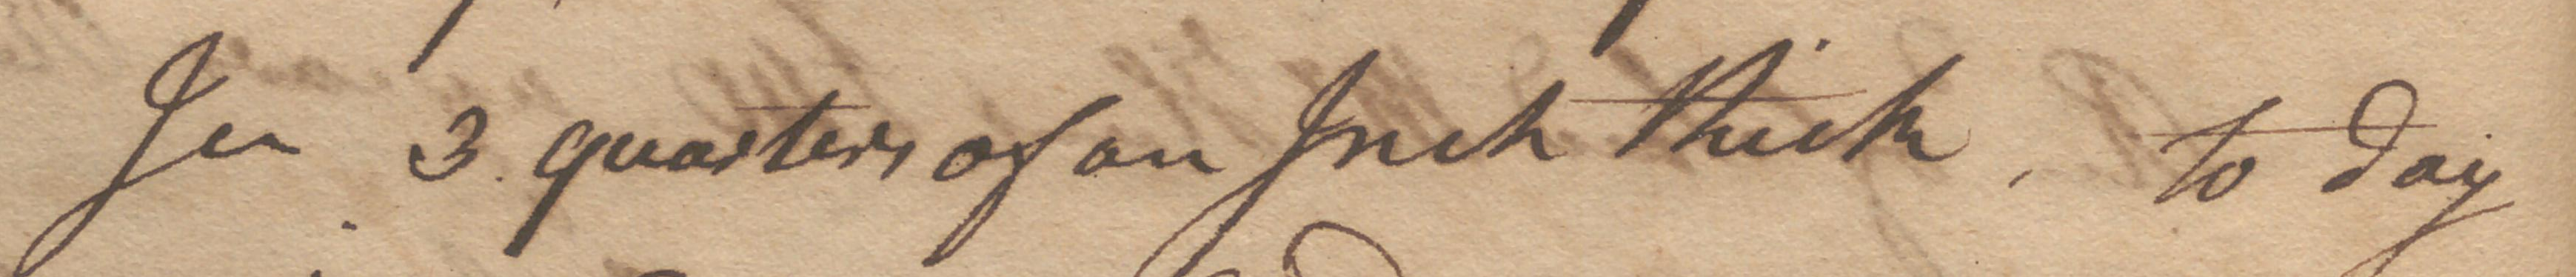Ice 3 quarters of an Inch thick, to day
